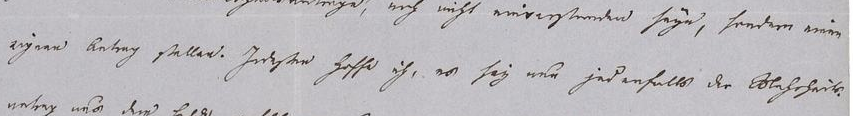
eignen Antrag stellen. Indeßen hoffe ich, es sey nun jedenfalls der Mehrheits-
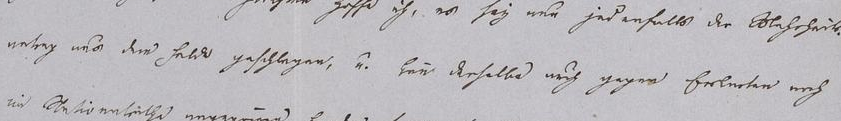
antrag aus dem Felde geschlagen, u. wenn derselbe auch gegen Erwarten noch
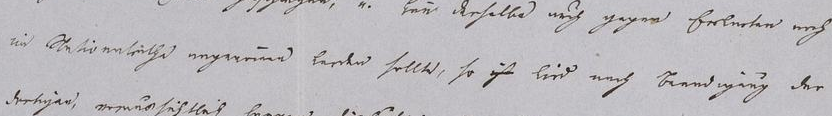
im Nationalrathe angenommen werden sollte, so ist wird nach Beendigung der
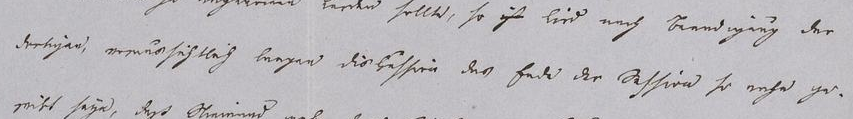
dortigen, voraussichtlich langen Diskussion das Ende der Session so nahe ge-
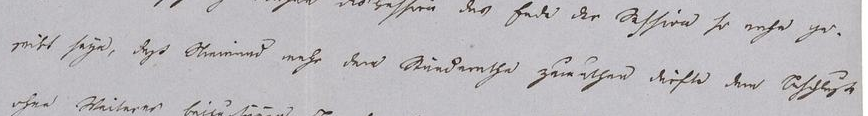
rückt seyn, daß Niemand mehr dem Ständerath zumuthen dürfte dem Beschluße
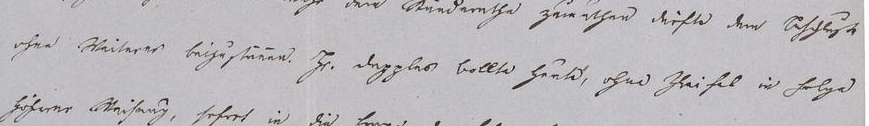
ohne Weiteres beizustimmen. Hr. Dapples wollte heute, ohne Zweifel in Folge
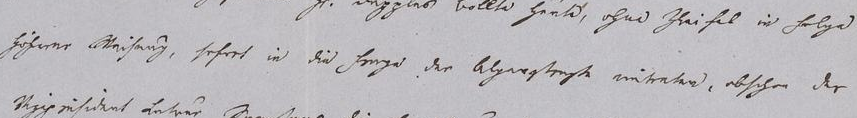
höherer Weisung, sofort in die Frage der Alpenstraße eintreten, obschon der
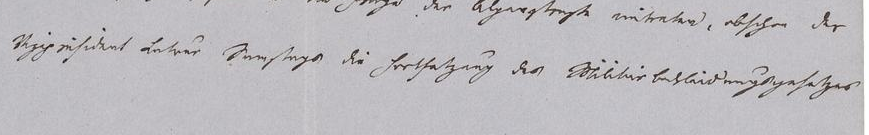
Vizepräsident LatourSamstags die Fortsetzung des Militärbekleidungsgesetzes
